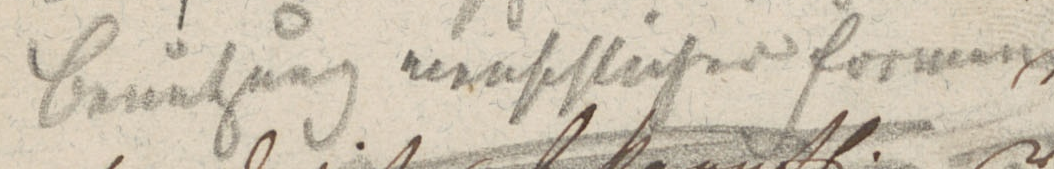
Benützung menschlicher Formen in
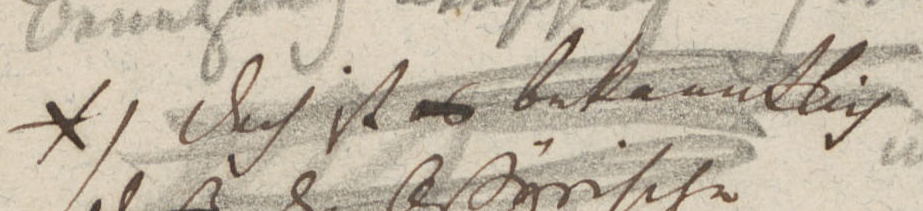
%) Doch ist es bekanntlich
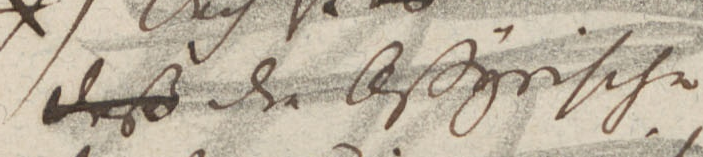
dass die Assyrische
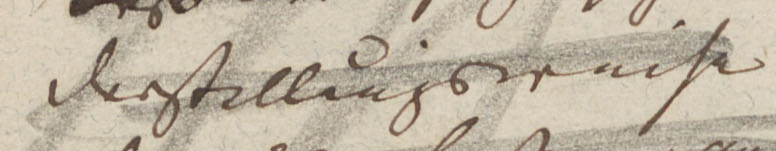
Darstellungsweise
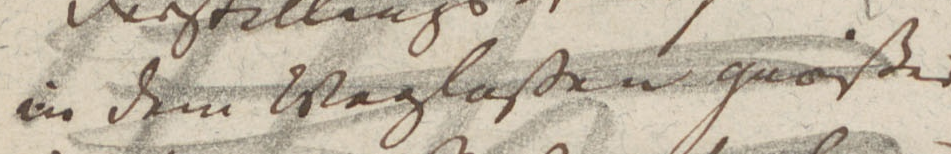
in dem Weglassen gewisser
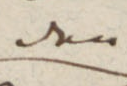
oder
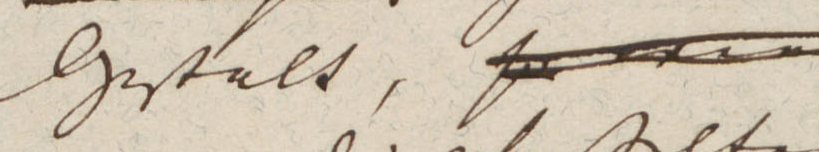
Gestalt, so wenig
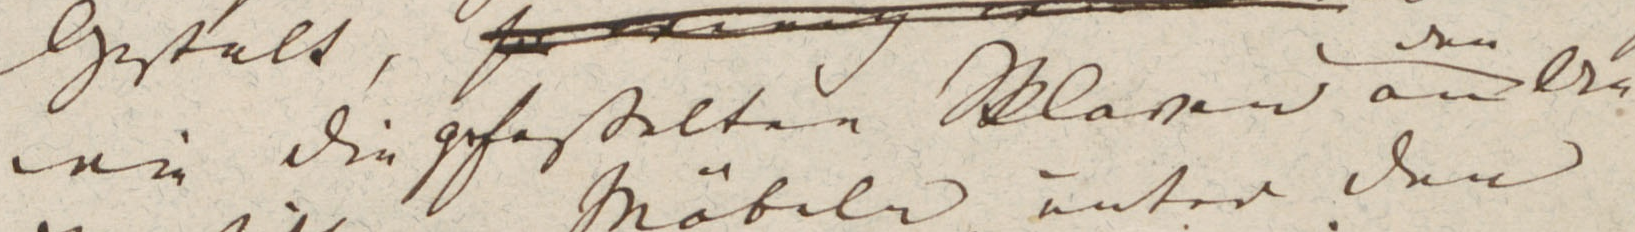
wie die gefesselten Sklaven an den
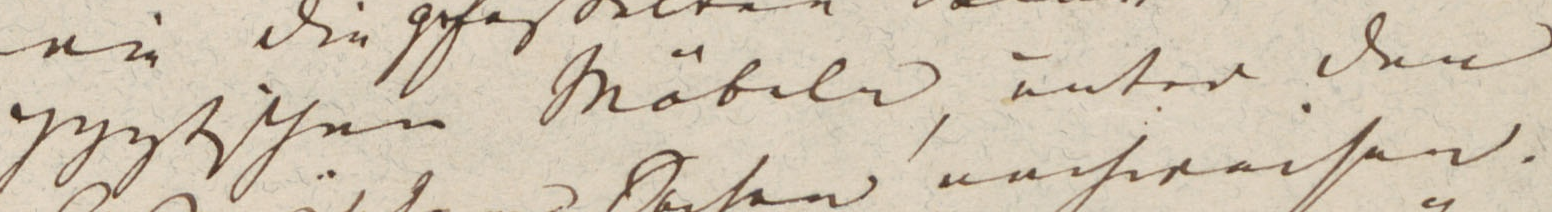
gyptischen Möbeln, unter den
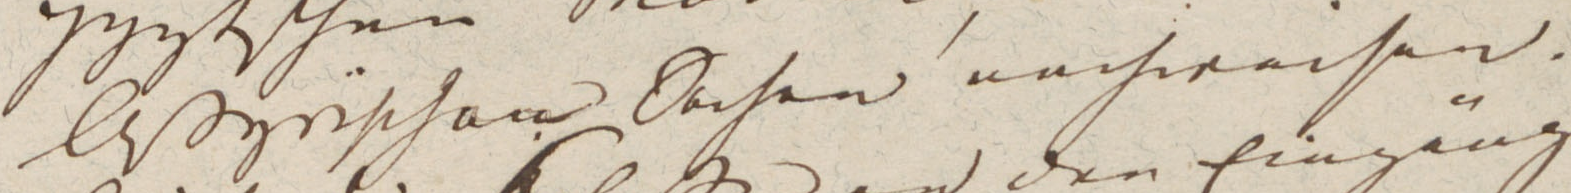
Assyrischen Sachen nachweisen.
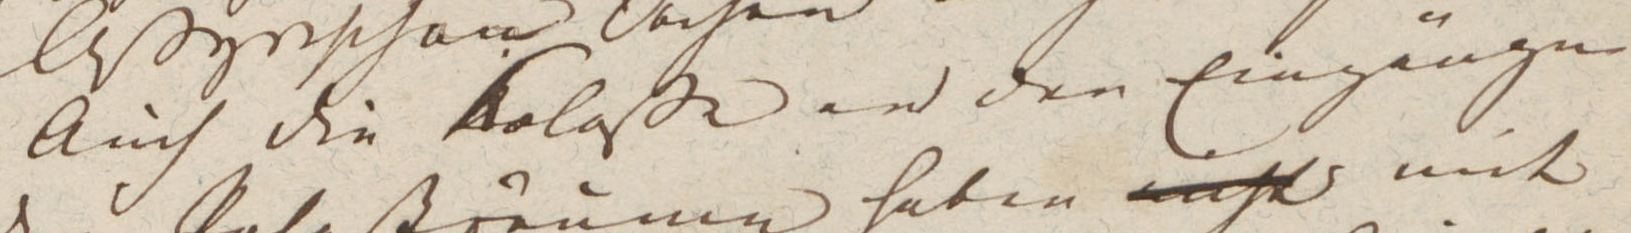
Auch die kKolosse an den Eingängen
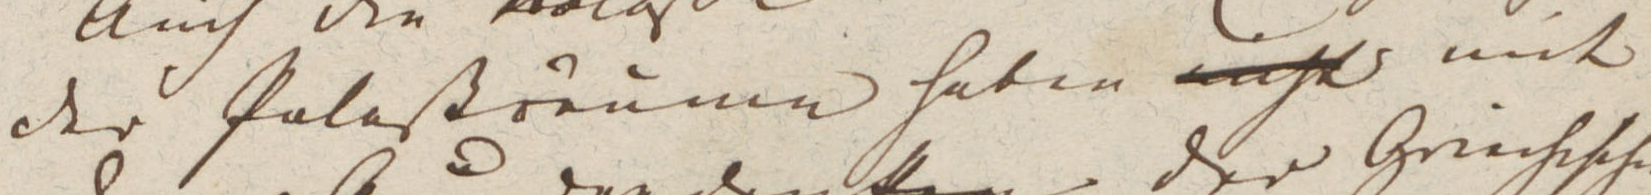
der Palasträume haben nicht mit
